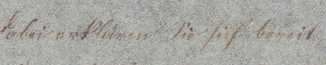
herigen Thätigkeit im Gebiete
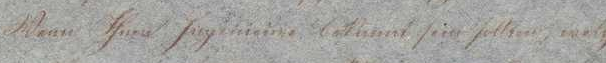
sein, mir zugleich bekannt zu geben, welche
